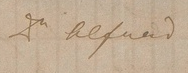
Dr Alfred
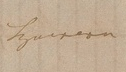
Escher in
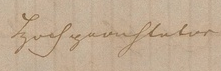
Hochgeachteter
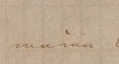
habe ich
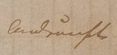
Ihnen durch
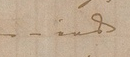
– und
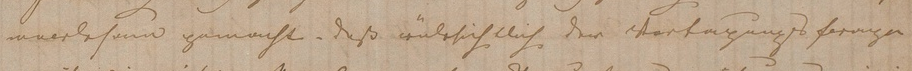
merksam gemacht – daß rüksichtlich der Vertagungsfrage
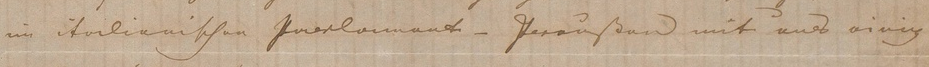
im italienischen Parlament – Preußen mit uns einig
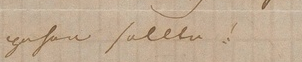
gehen sollte!
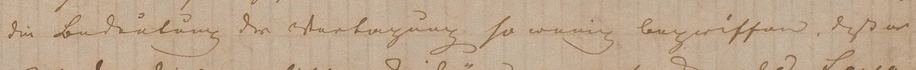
die Bedeutung der Vertagung so wenig begriffen, daß er
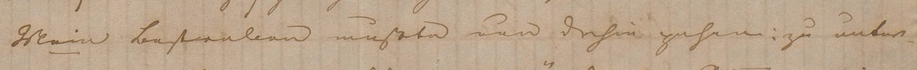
Mein Bestreben mußte nun dahin gehen: zu unter-
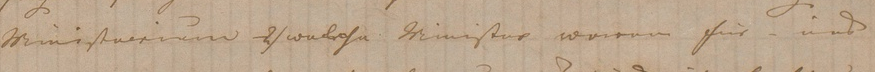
Ministerium 2) welche Minister waren für – und
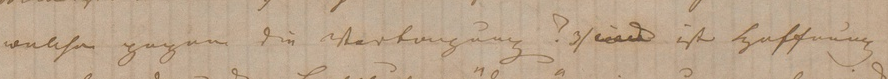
welche gegen die Vertagung? 3) wie ist Hoffnung
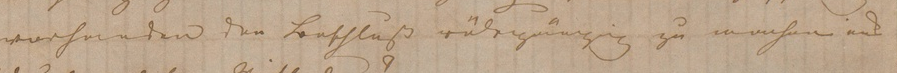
vorhanden den Beschluß rükgängig zu machen und
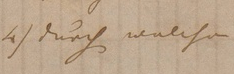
4) durch welche
